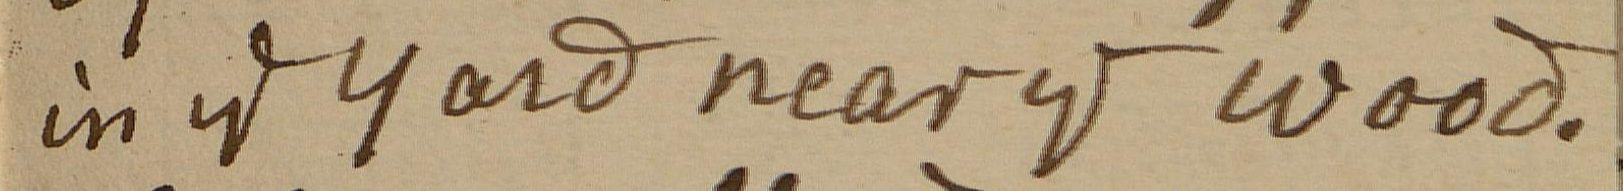in y^e Yard near y^e wood.
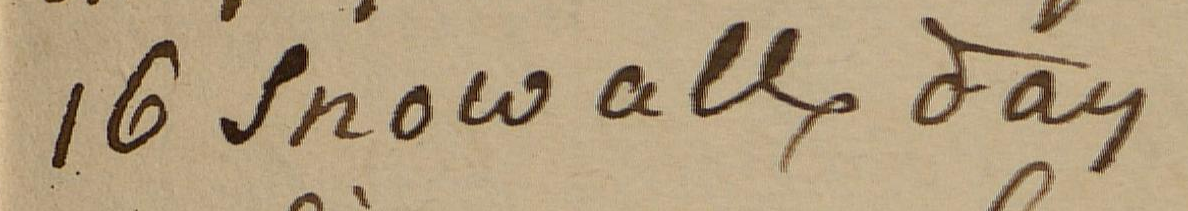16 Snow all day
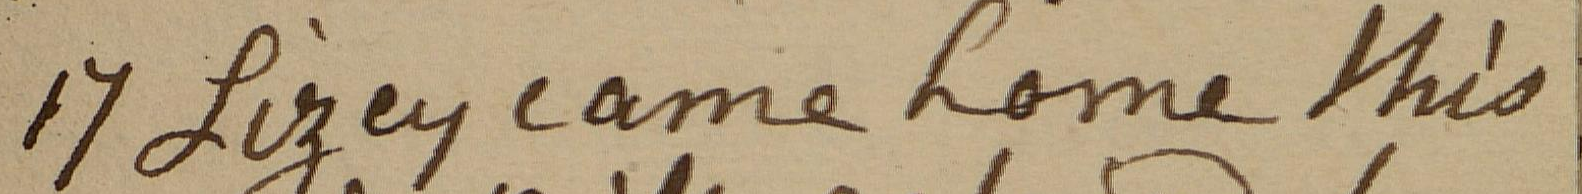17 Lizey came home this
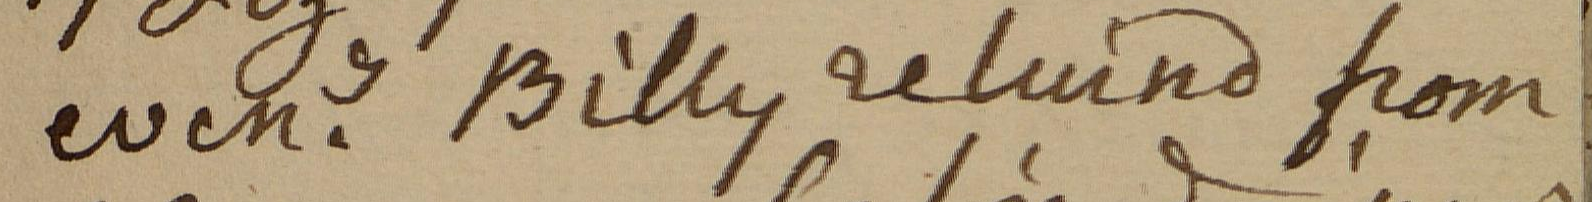even^g. Billy returnd from
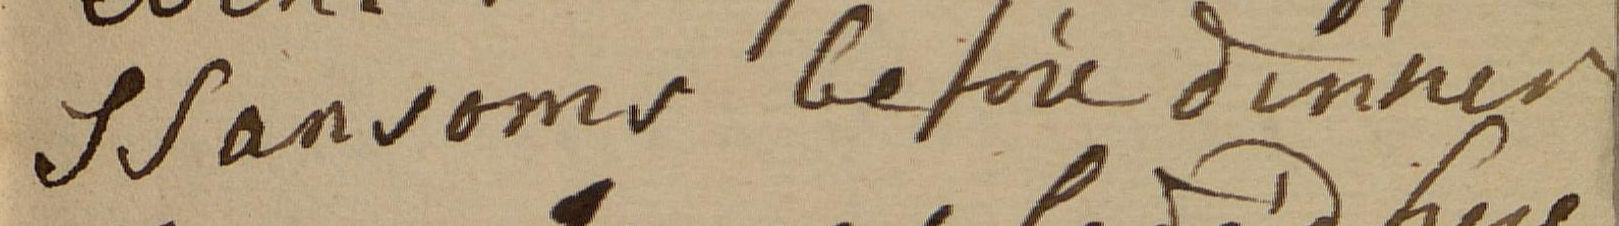S Sansoms before dinner
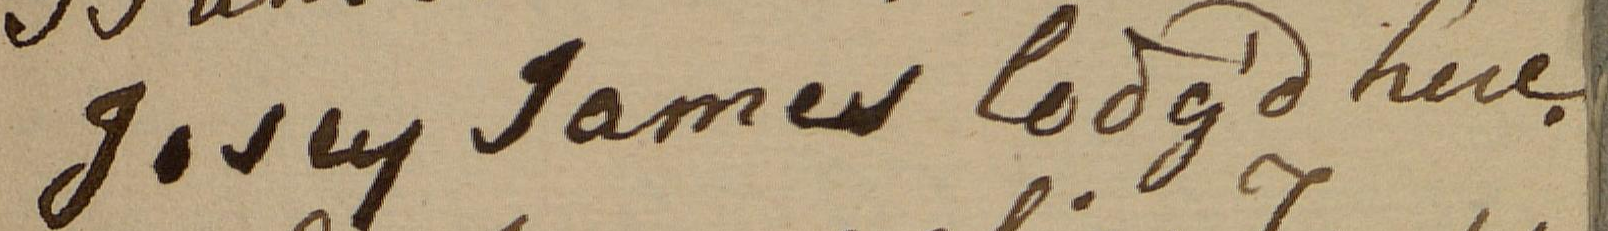Josey James lodg'd here.
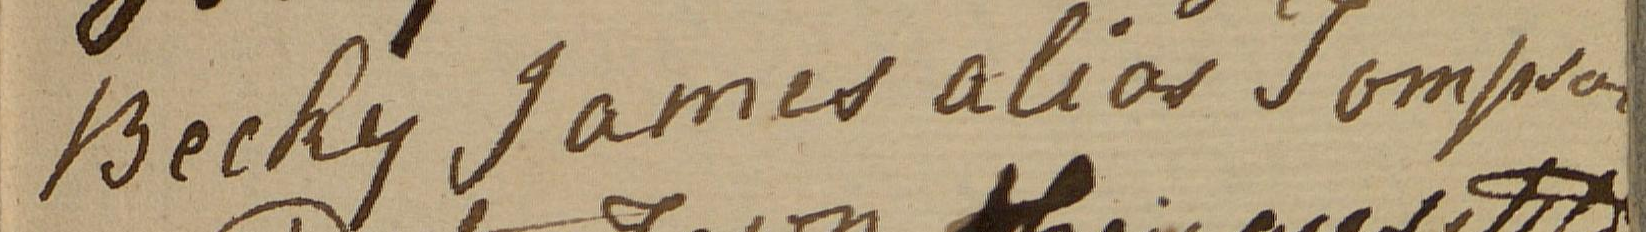Becky James alias Tompson
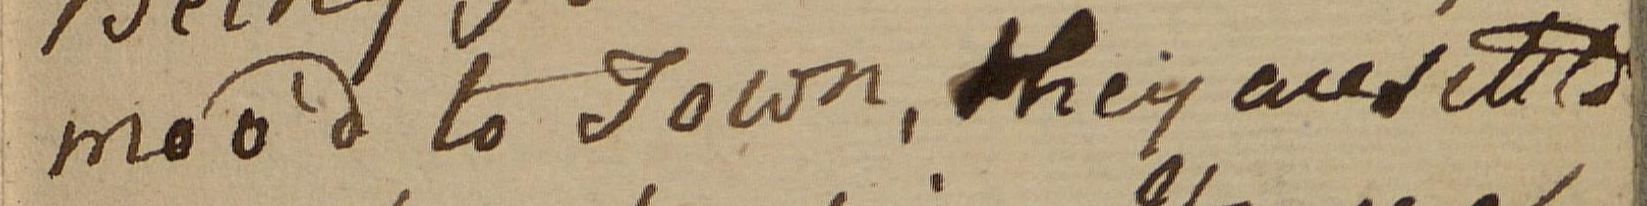mov'd to Town, they are settld
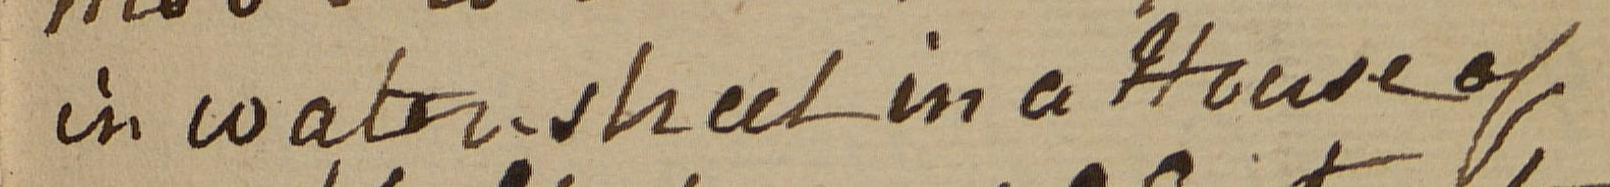in water-street in a House of
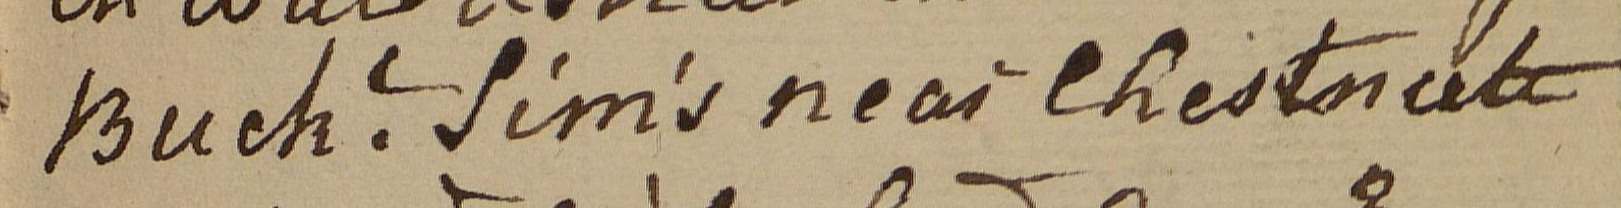Buch^c. Sim's near Chestnutt
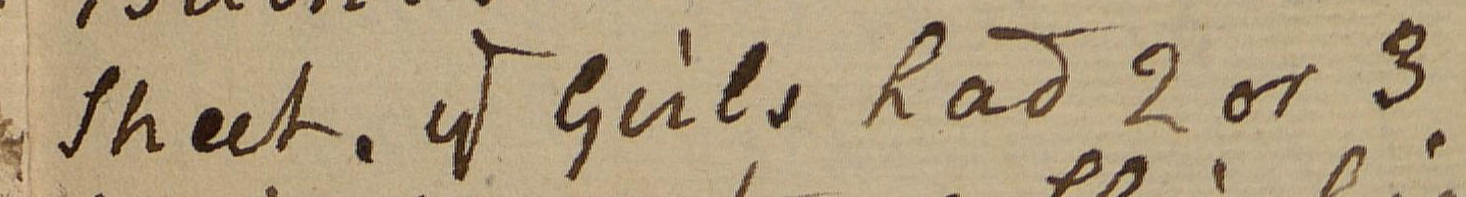Sheet, y^e Girls had 2 or 3
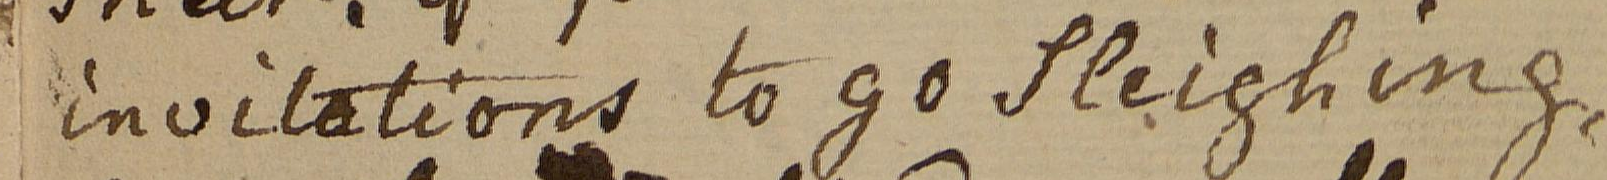invitations to go Sleighing,
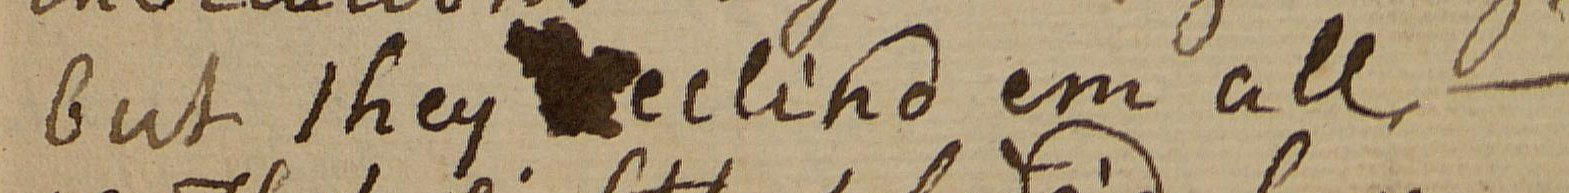but they declind em all,-
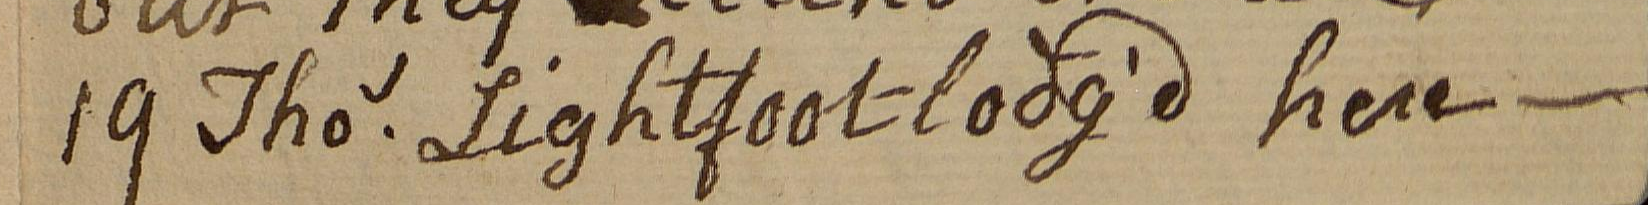19 Tho^s. Lightfoot-lodg'd here-
